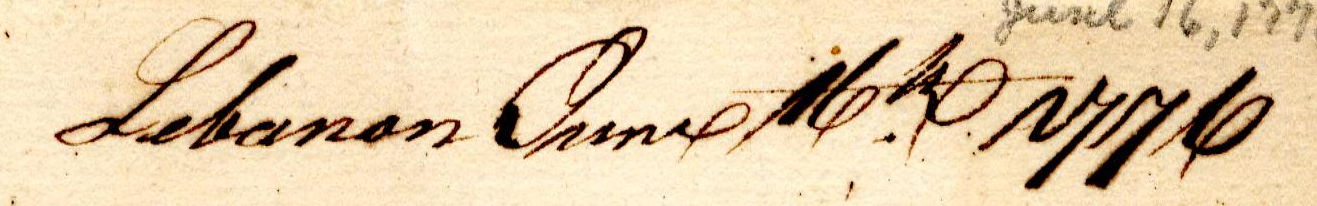Lebanon June 16^th. 1776
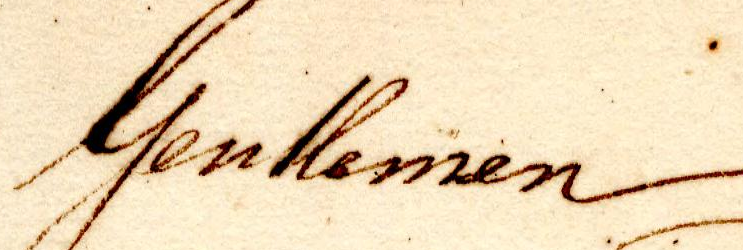Gentlemen
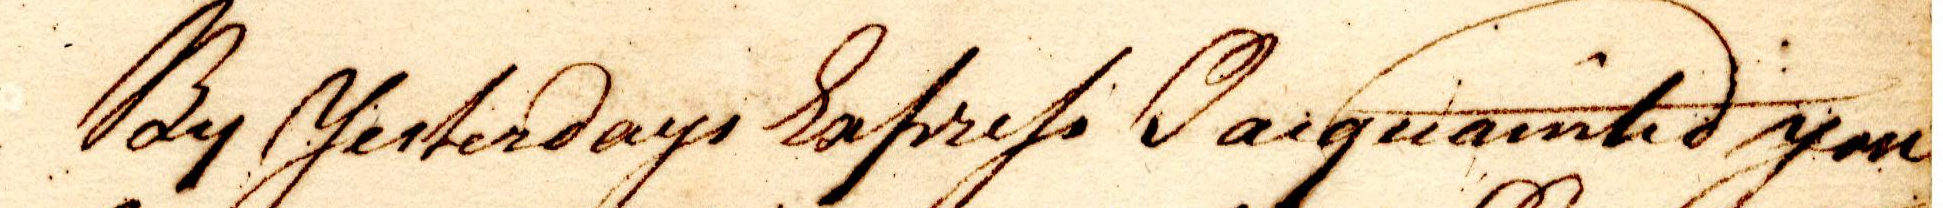By Yesterdays Express I acquainted you
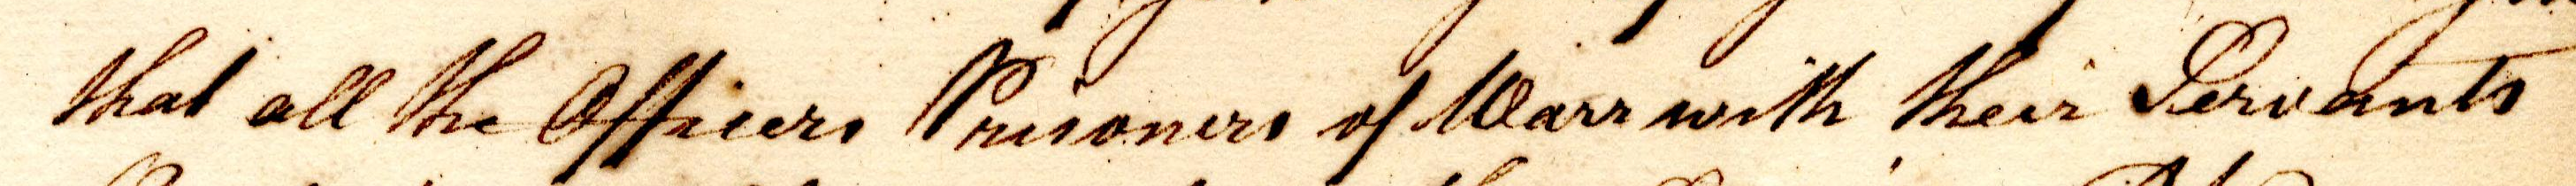that all the Officers Prisoners of Warr with their Servants
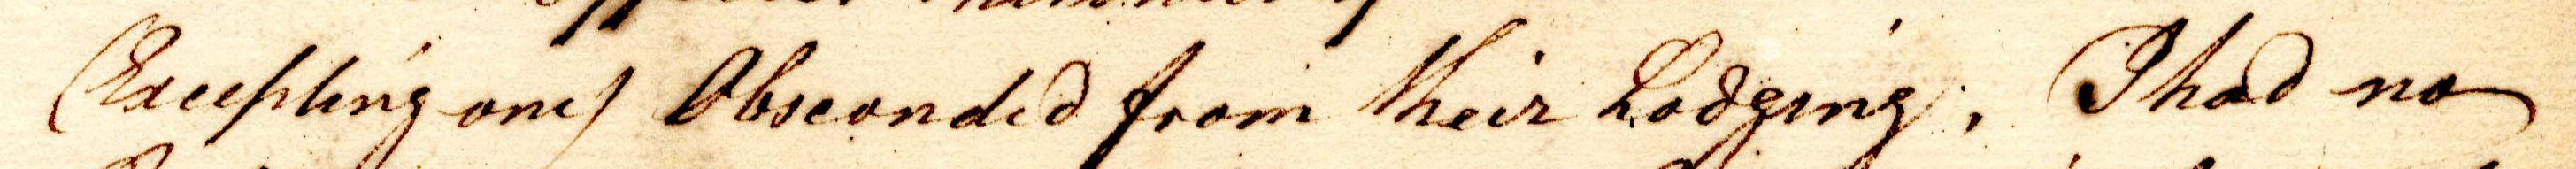(Excepting one) Absconded from their Lodging. I had no
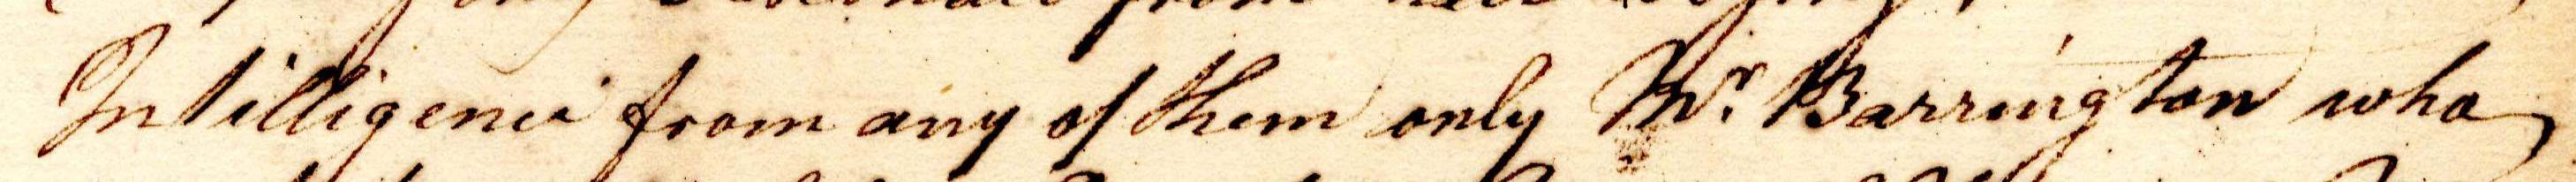Intelligence from any of them only M^r. Barrington who
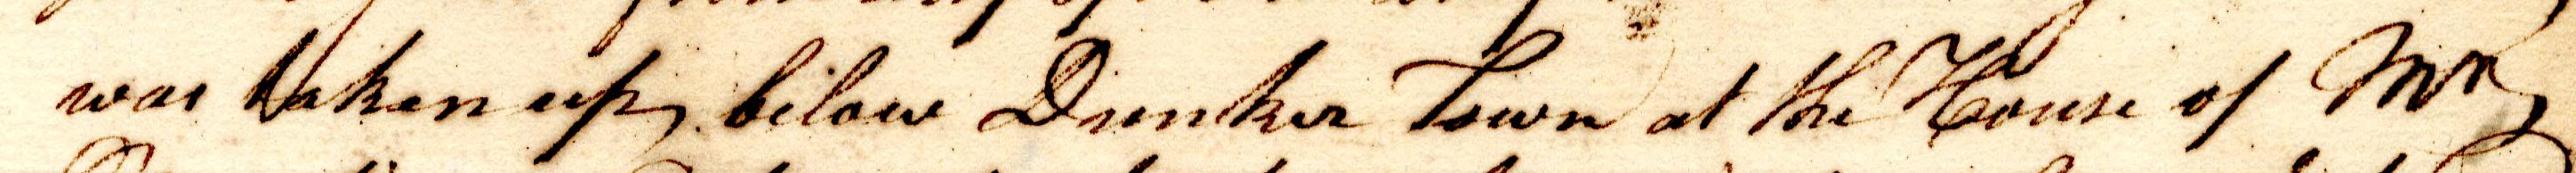was taken up below Drinker Town at the House of M^r
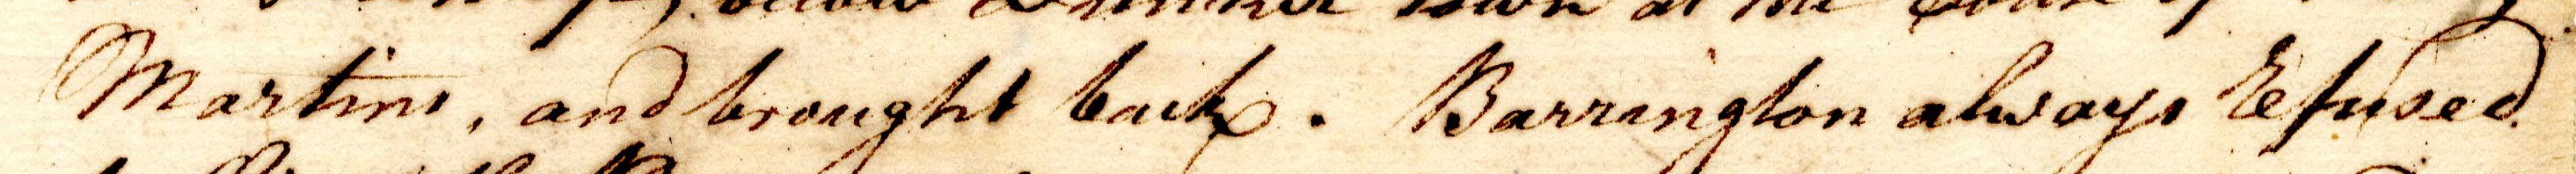Martins, and brought back. Barrington always refused
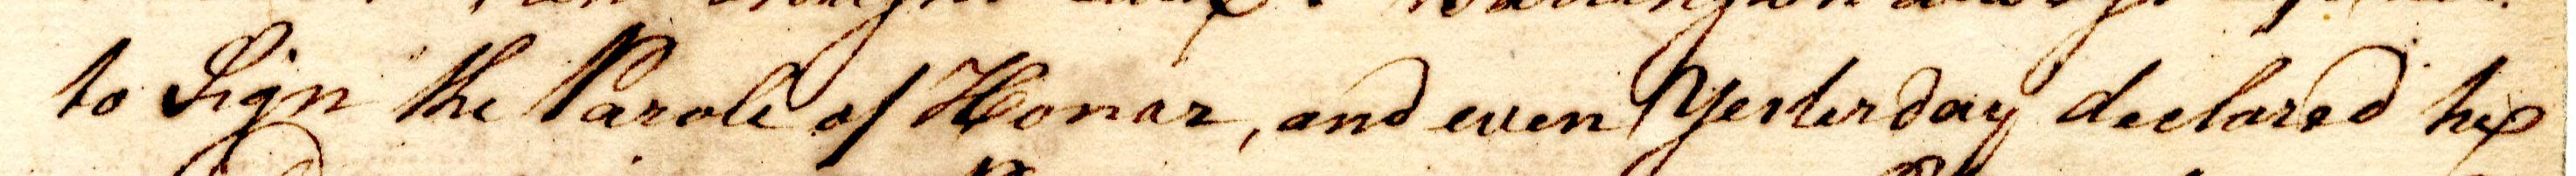to Sign the Parole of Honor, and even Yesterday declared he
